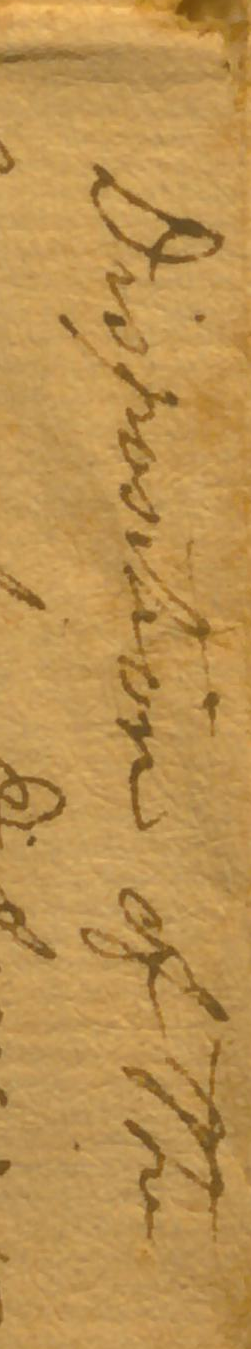Disposition of the
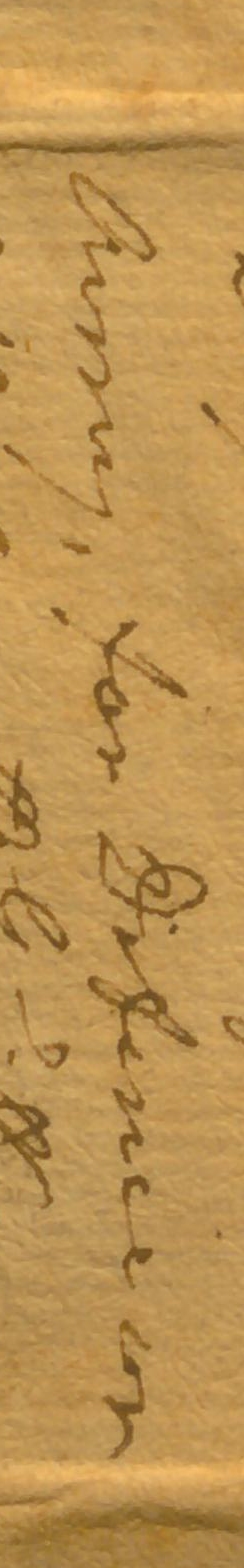Army for Defence on
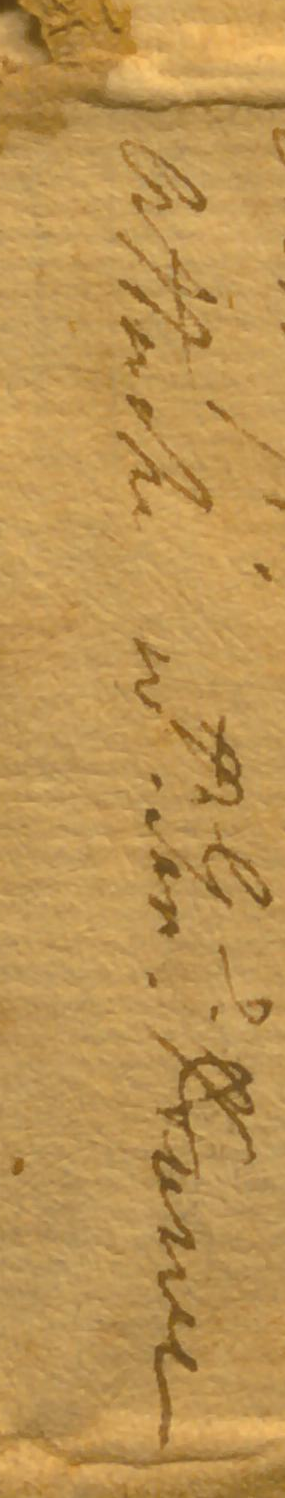Attack w^th. Gen^l. Howe
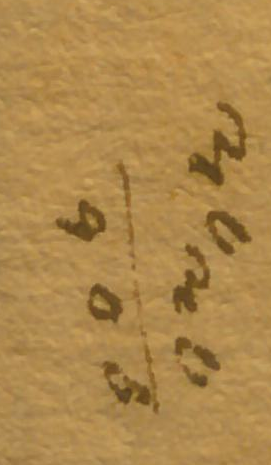3030
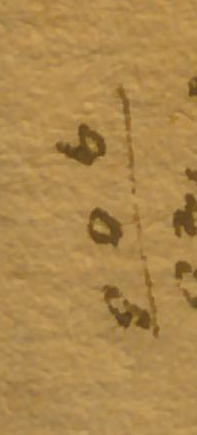900
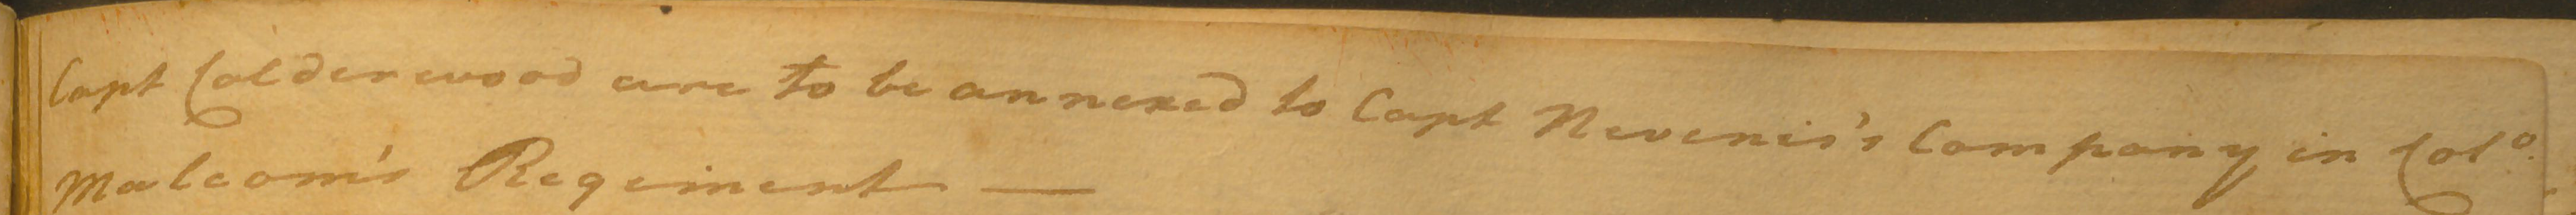Capt Colderwood are to be annexed to Capt Nevinis's Company in Col^o.
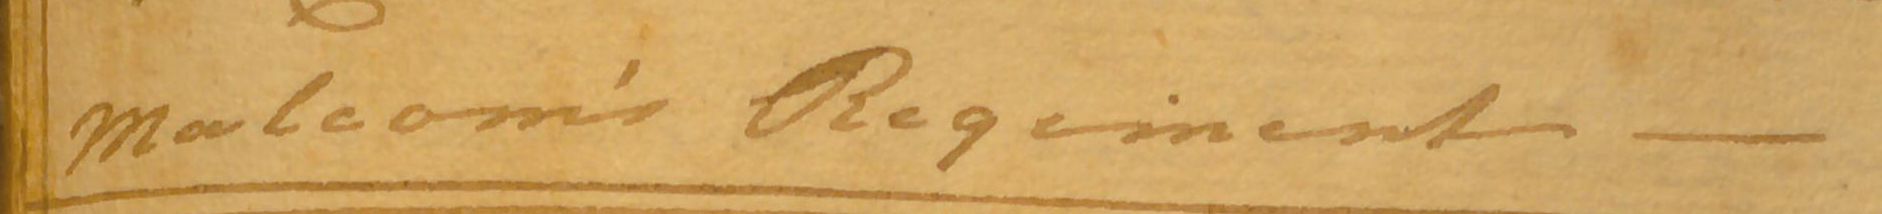Malcom's Regiment-
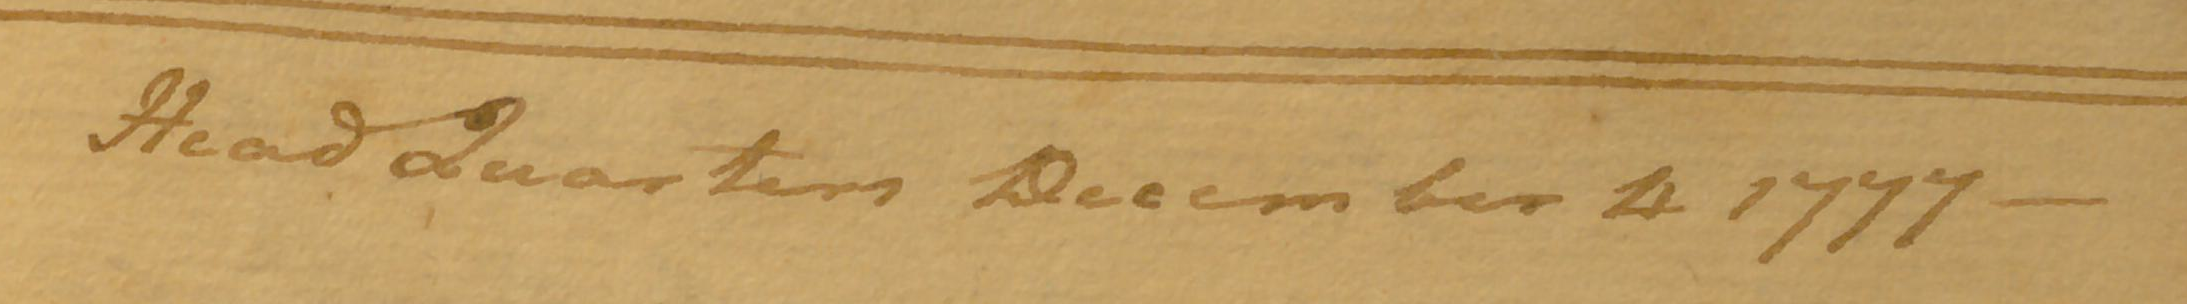Head Quarters December 4 1777-
